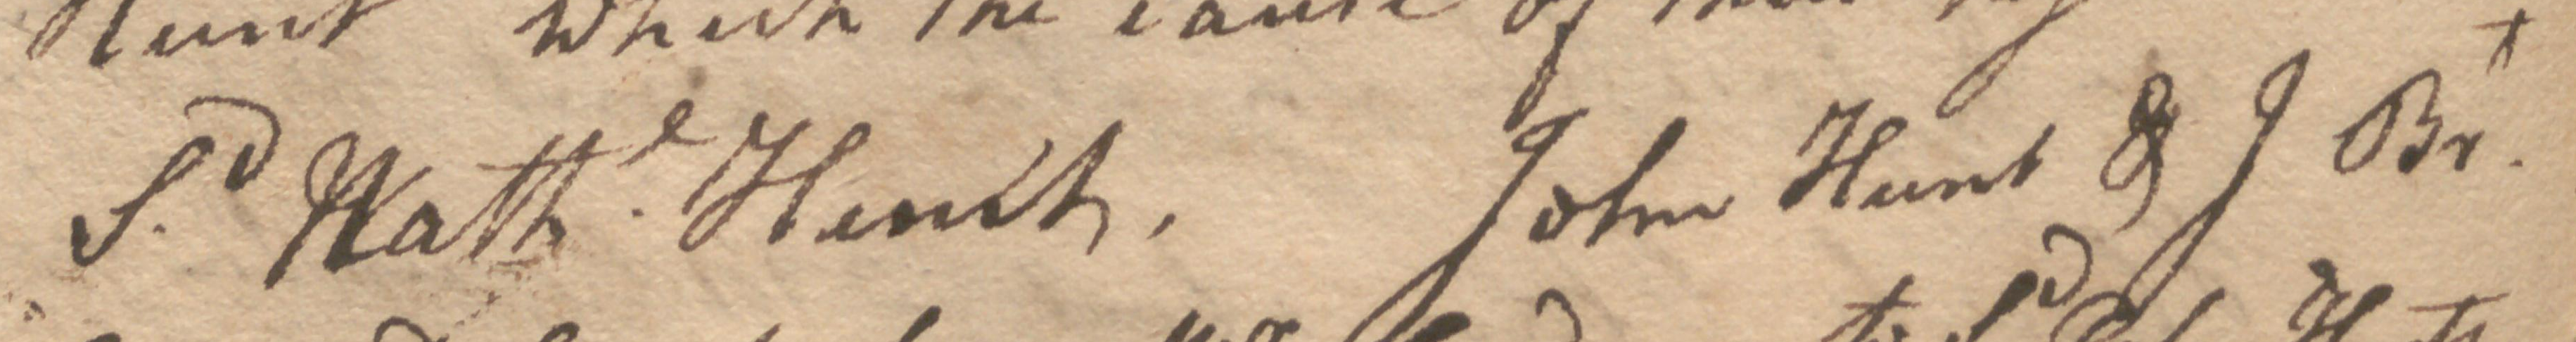S^d. Nath^l. Hunt. John Hunt & I Br^t.
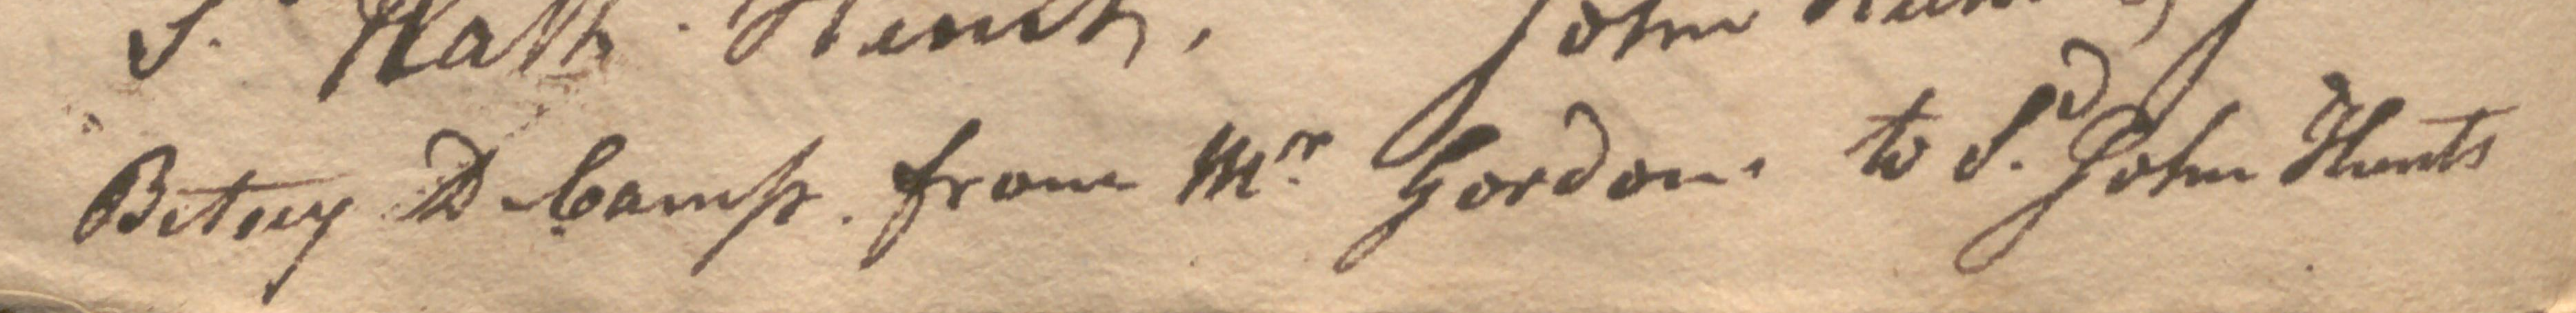Betsey DeCamp from M^r. Gordons to s^d. John Hunts
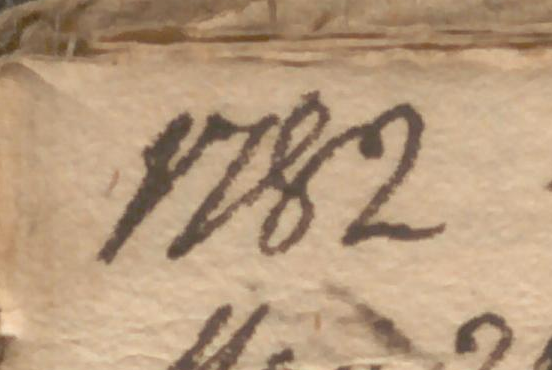1782
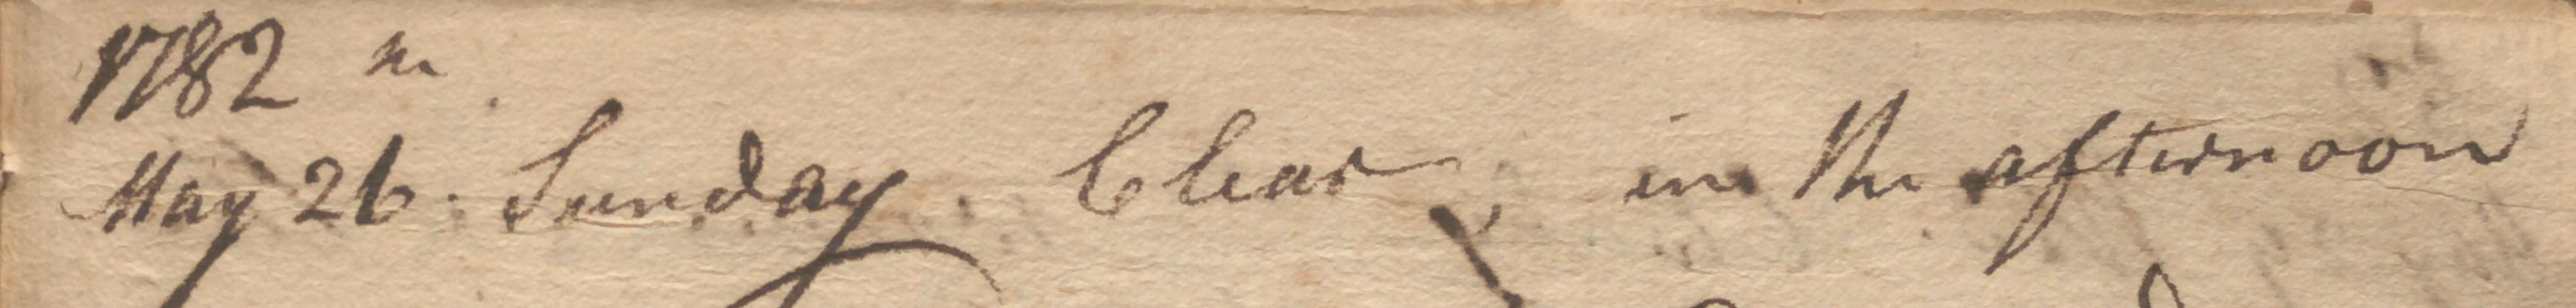May 26^th. Sunday. Clear, in the afternoon
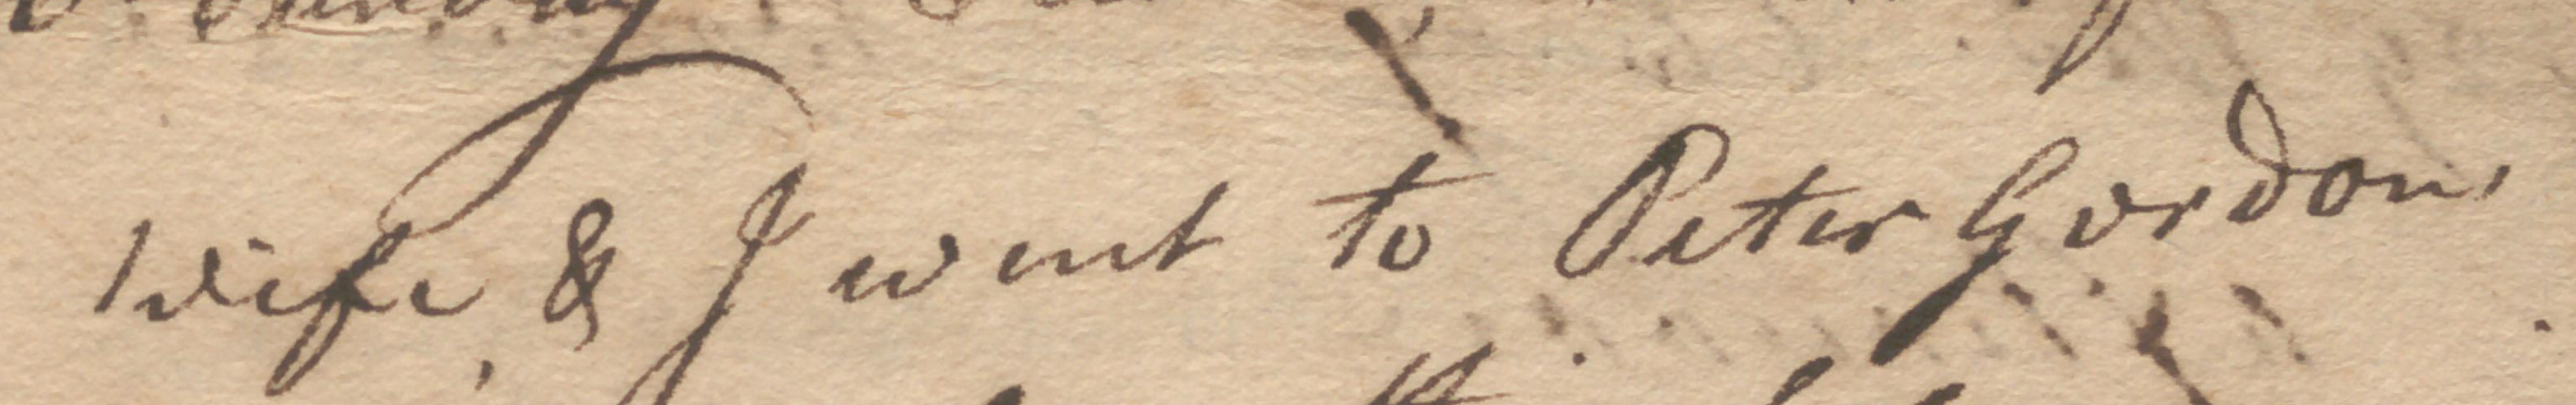wife & I went to Peter Gordons
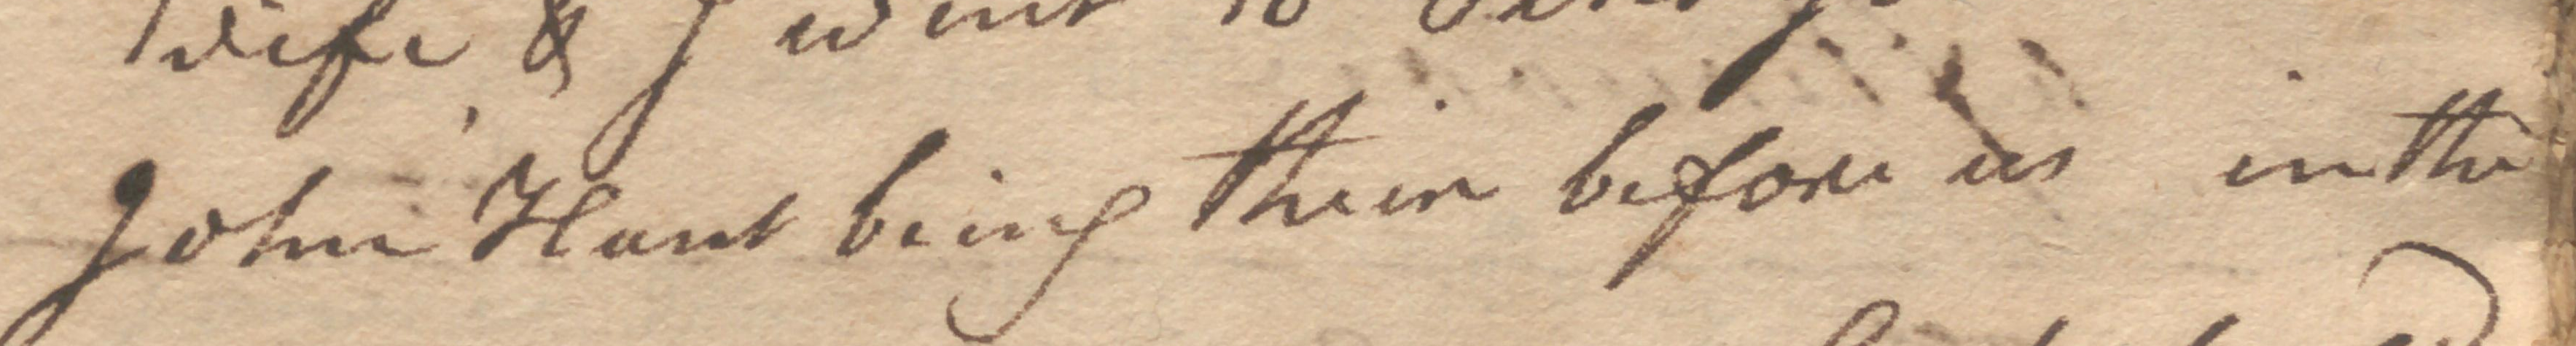John Hunt being their before us in the
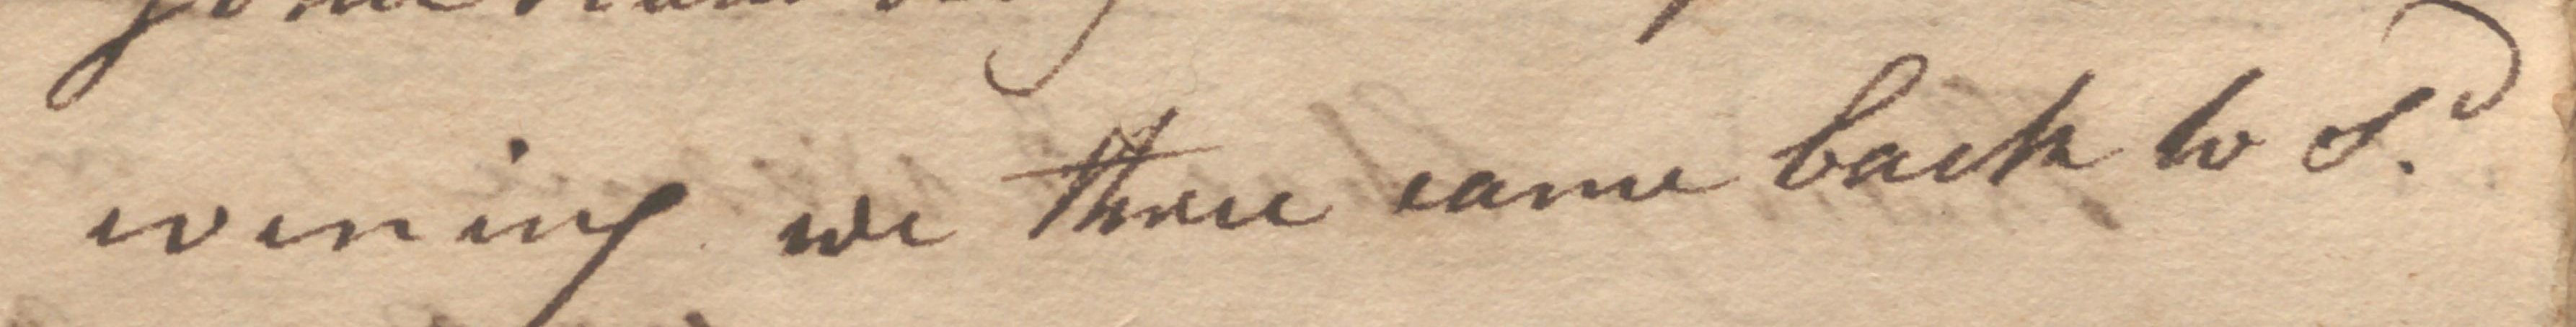evening, we three came back to s^d.
